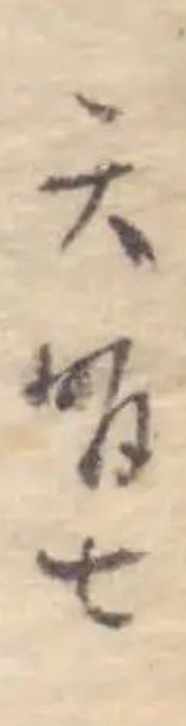天明七
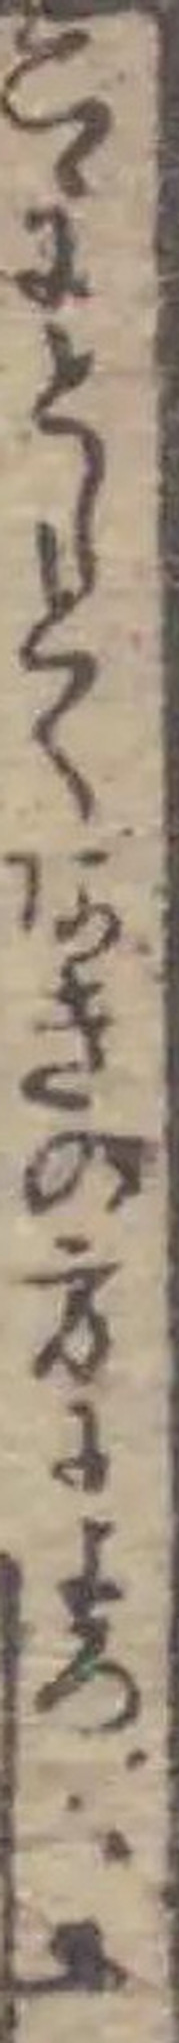こゝにとしとくあきの方によろ
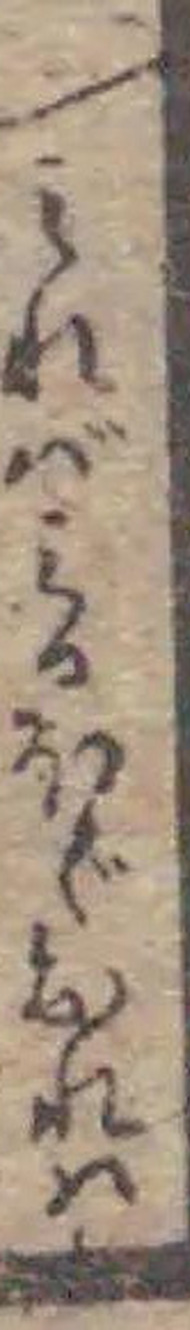みればみるほどおれは
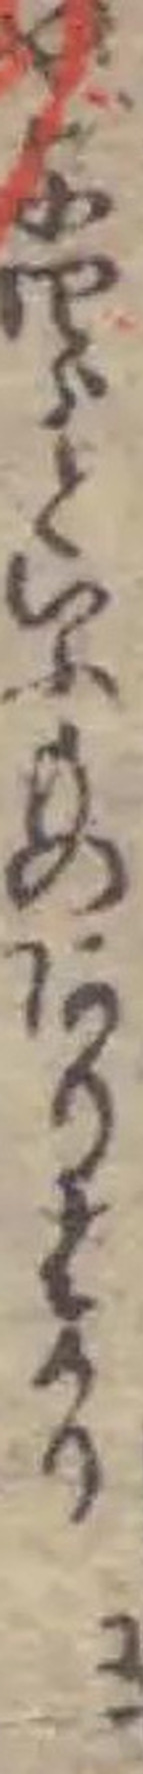づや与四郞といふものありはかり
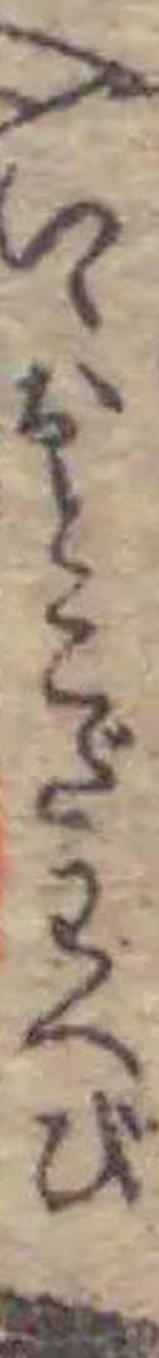いゝおとこだわへび
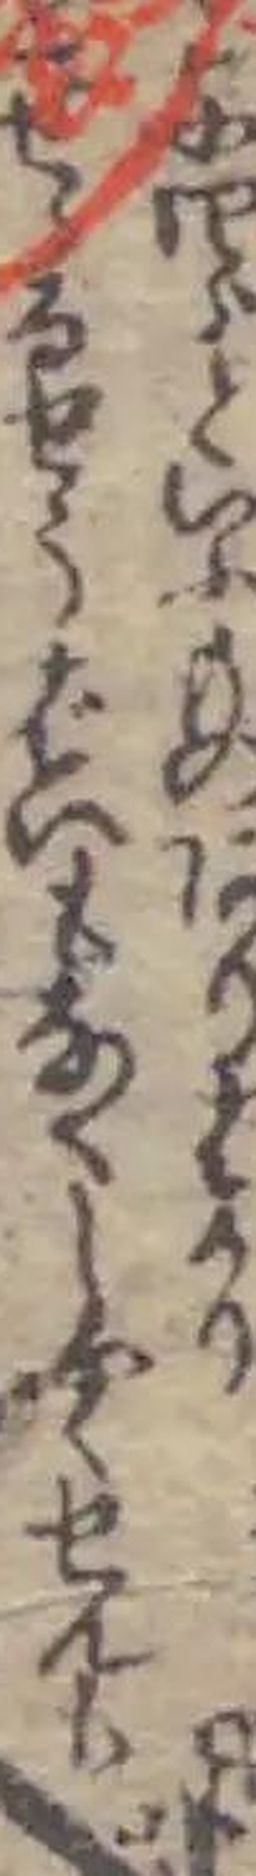めをせゝるうばいもなくしやくせんも
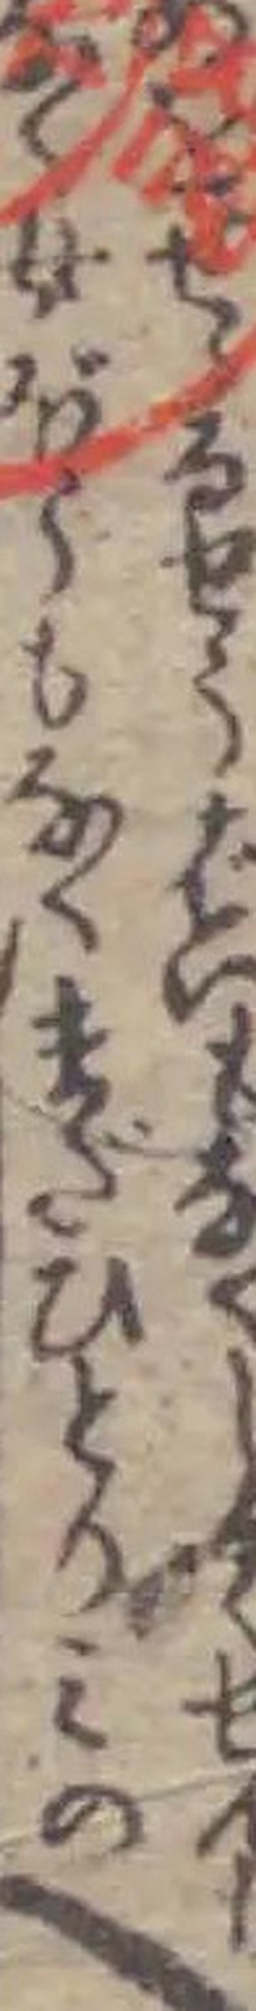なく女ぼうもなくまだひとりみの
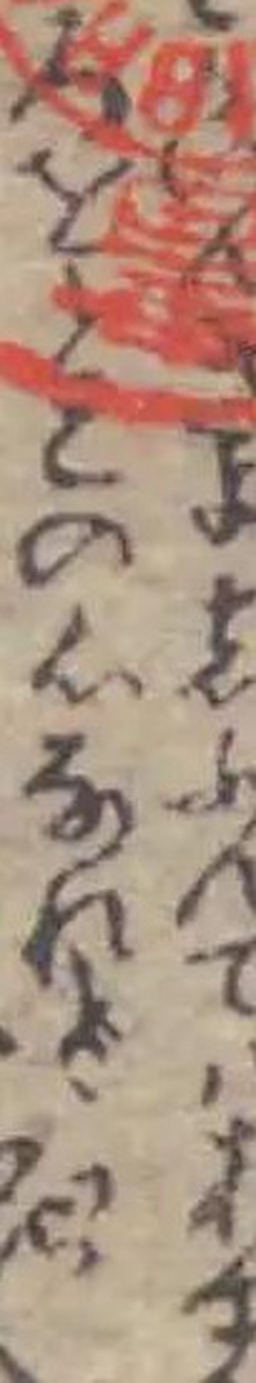いろおとこの心なれど
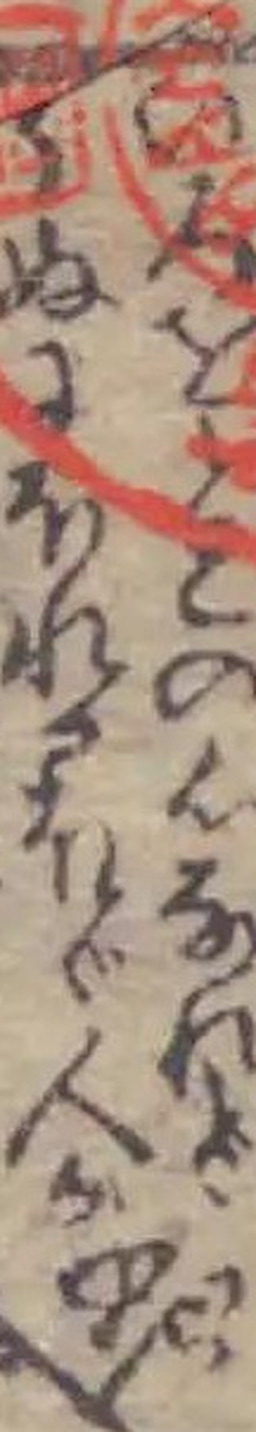うぬにほれるほど人か
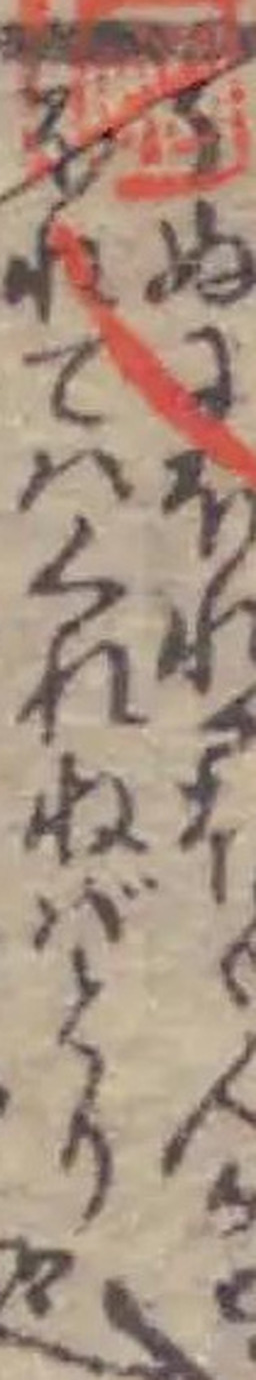ほれてはくれねばとり
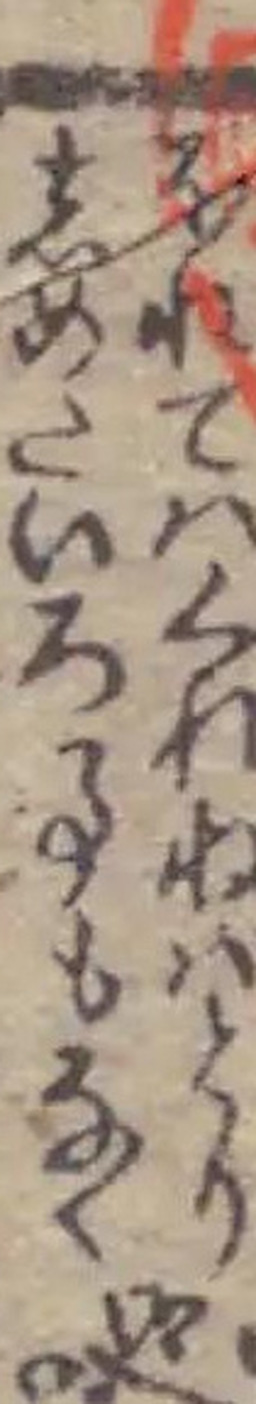しめたいろ事もなく
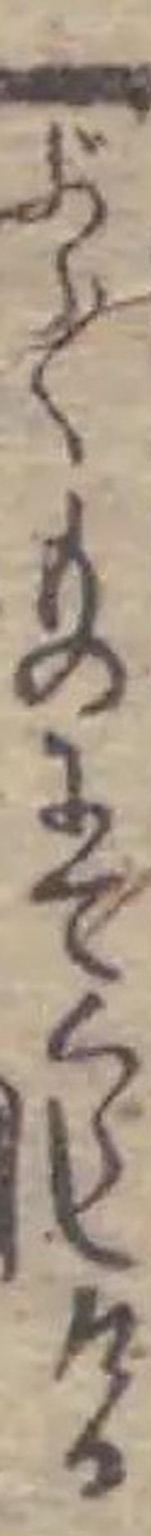ぶら〳〵ものにてくらしける
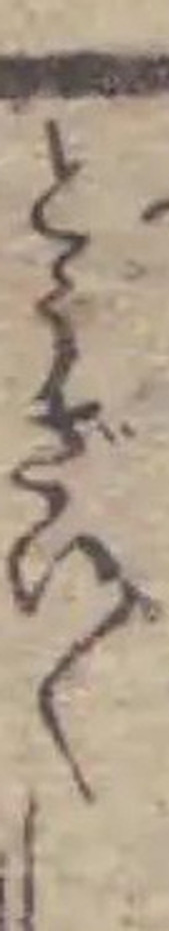とうざい〳〵
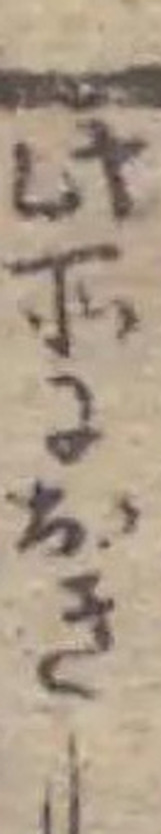此所におき
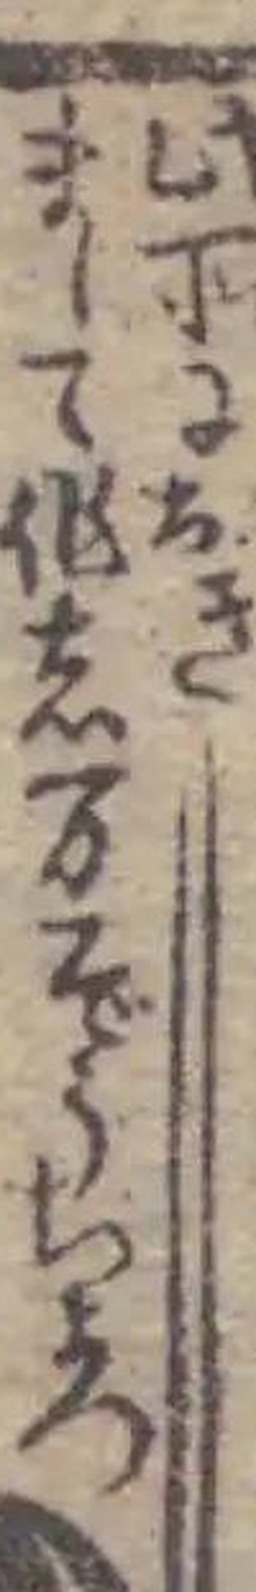まして作者万ぞうちよつ
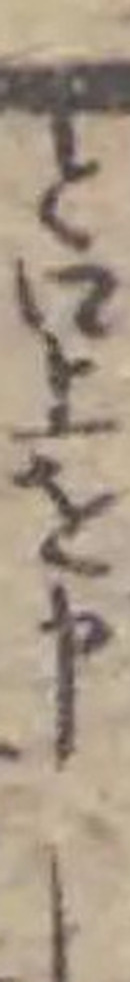と口上を申
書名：色男其処此処 3巻
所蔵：国立国会図書館 National Diet Library, JAPAN
